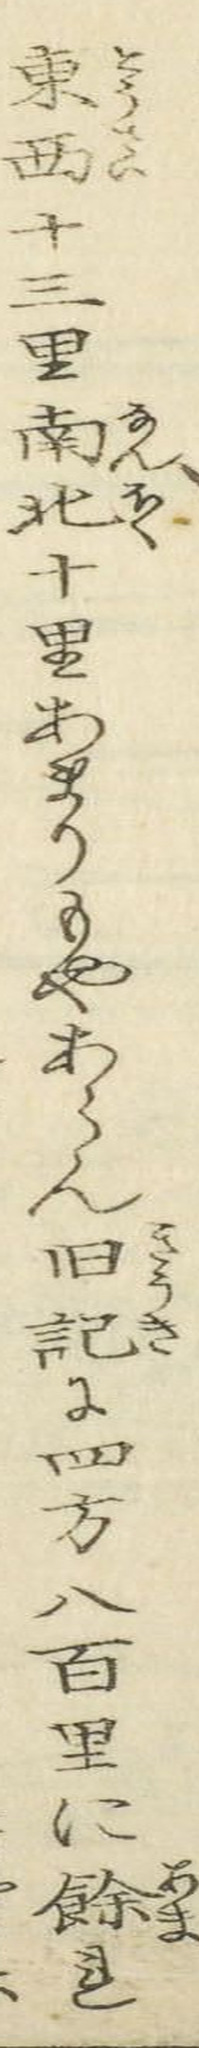東西十三里南北十里あまりもやあらん旧記に四方八百里に余れ
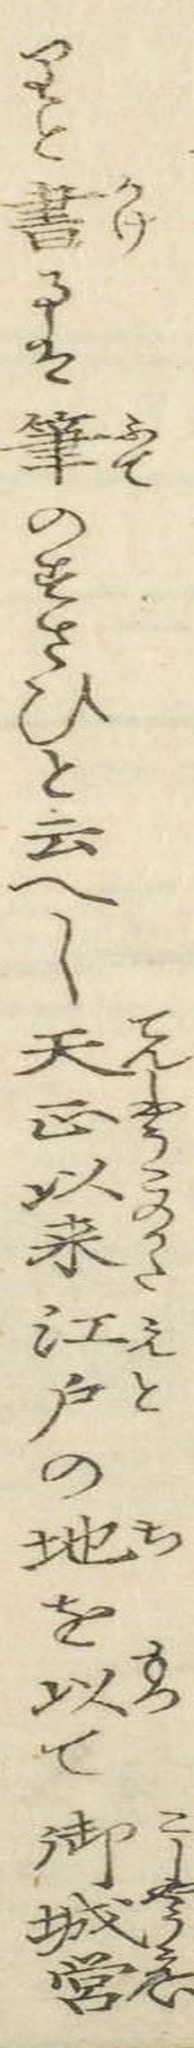りと書るは筆のすさひと云へし天正以来江戸の地を以て御城営
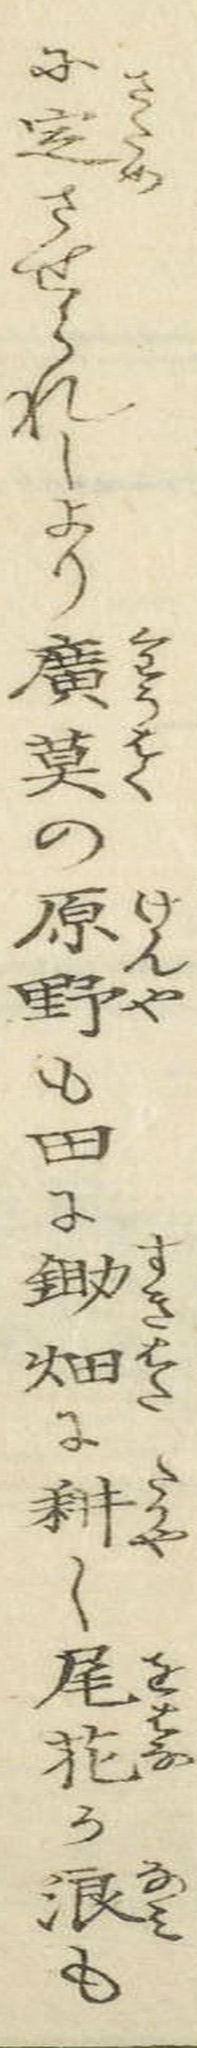に定させられしより広莫の原野も田に鋤畑に耕し尾花か浪も
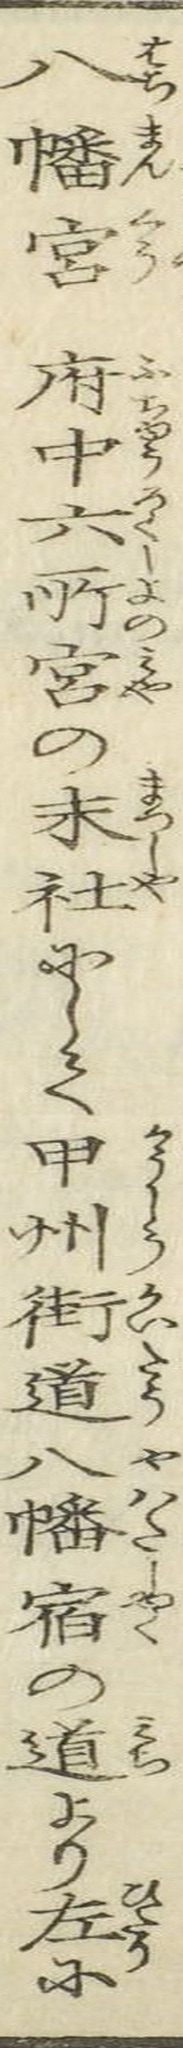八幡宮府中六所宮の末社にして甲州街道八幡宿の道より左に
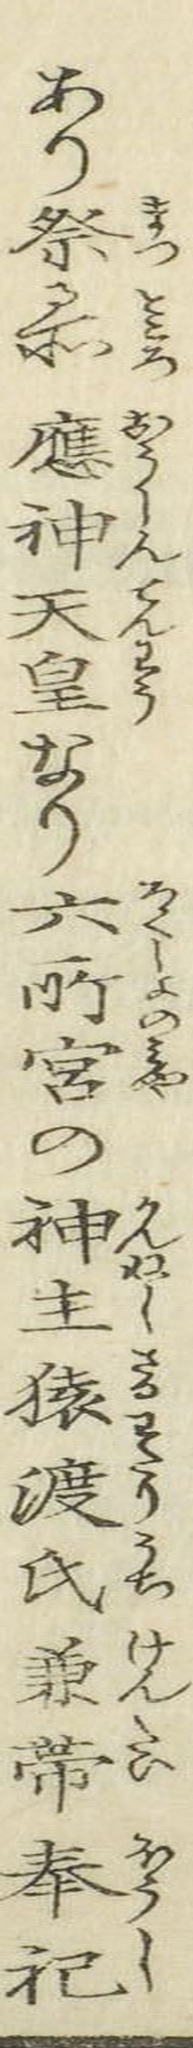あり祭る所応神天皇なり六所宮の神主猿渡氏兼帯奉祀
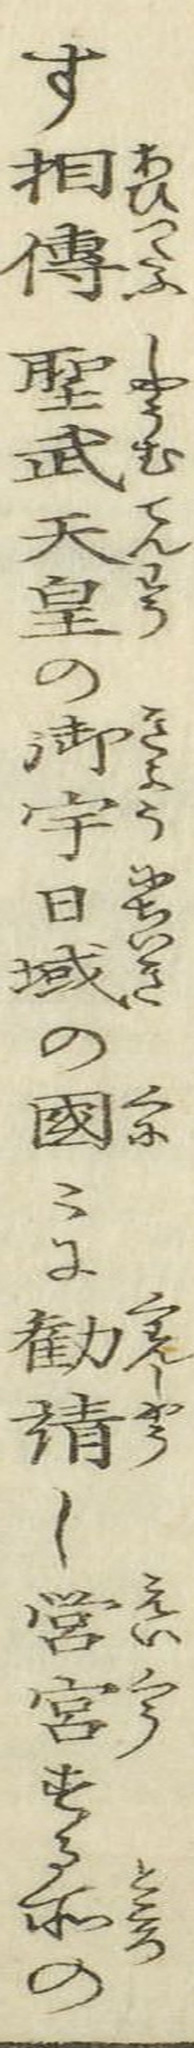す相伝聖武天皇の御宇日域の国々に勧請し営宮する所の
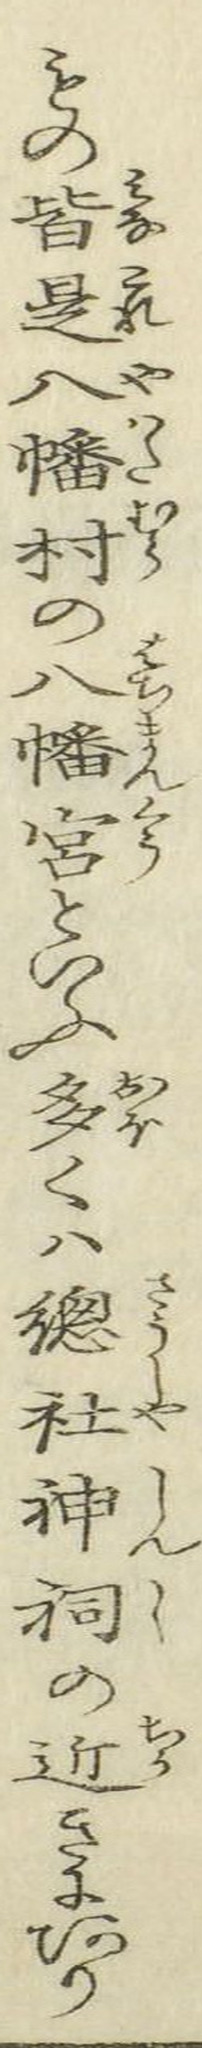もの皆是八幡村の八幡宮といふ多くは総社神祠の近きにあり
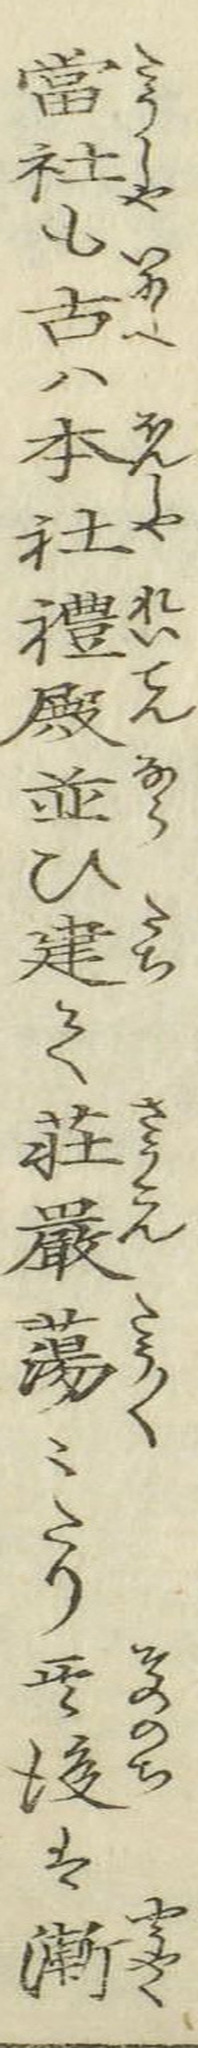当社も古は本社礼殿並ひ建て荘厳蕩々たり其後は漸
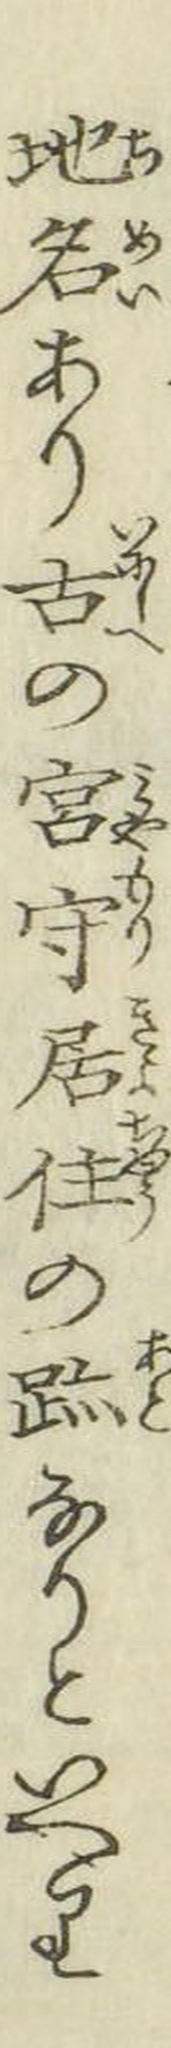地名あり古の宮守居住の跡なりといへり
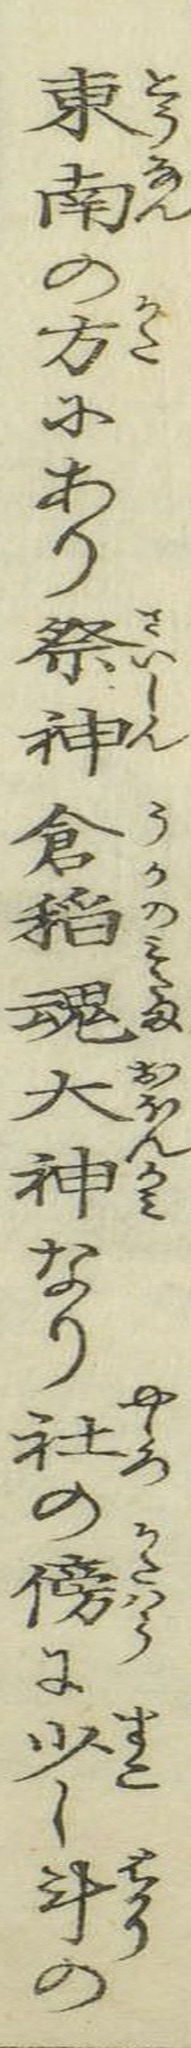東南の方にあり祭神倉稲魂大神なり社の傍に少し斗の

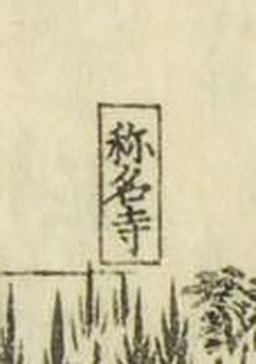称名寺
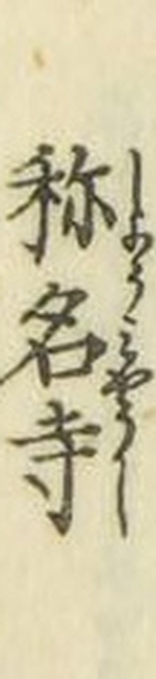称名寺
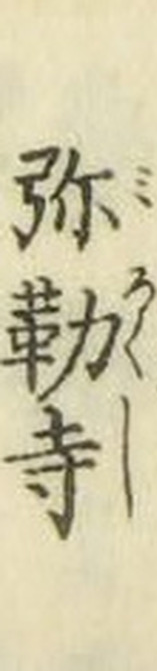弥勒寺
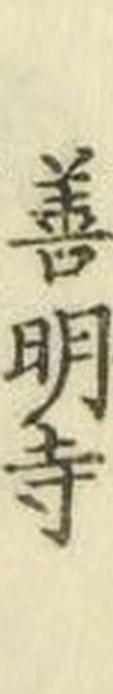善明寺
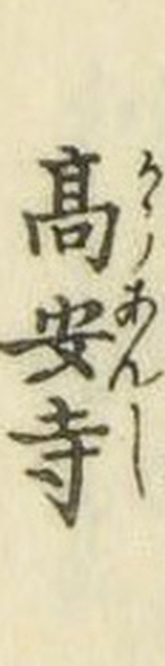高安寺
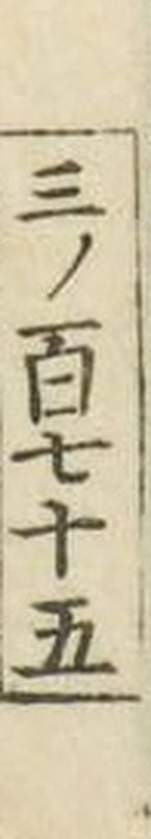三ノ百七十五
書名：江戸名所図会 20巻 巻之9
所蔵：東京学芸大学教育コンテンツアーカイブ
